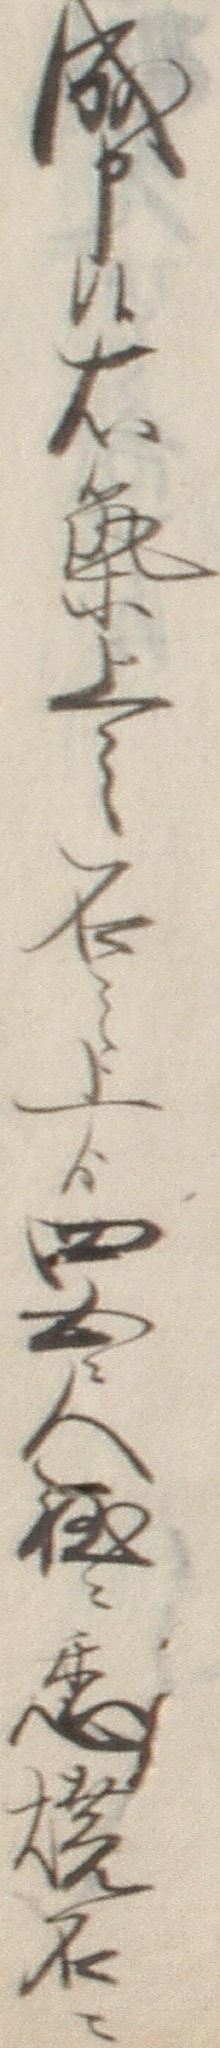成申候右築上之石之上ゟ四五尺程ニ悉焼石ニ

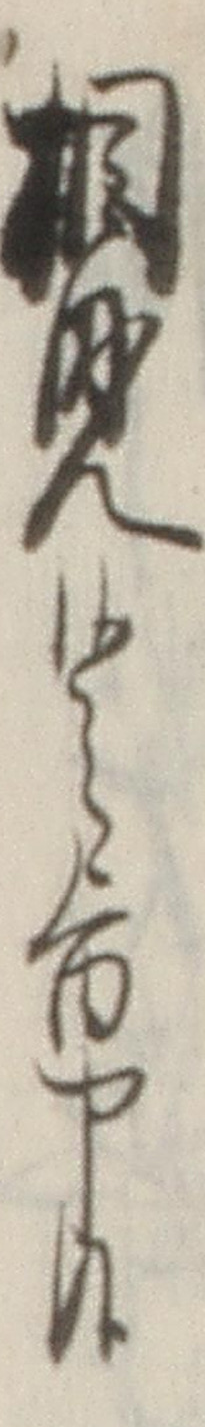相見候之旨申候
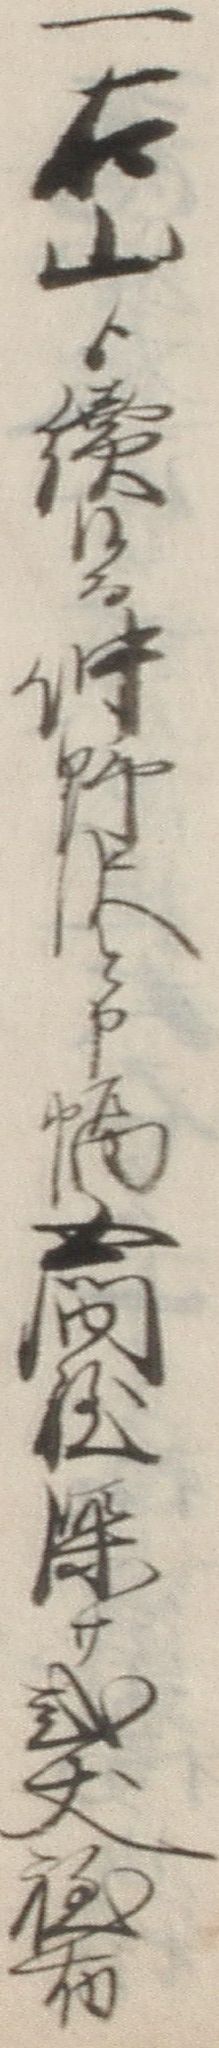一右山ゟ続候而中野沢と申幅五間程深サ弐丈程有
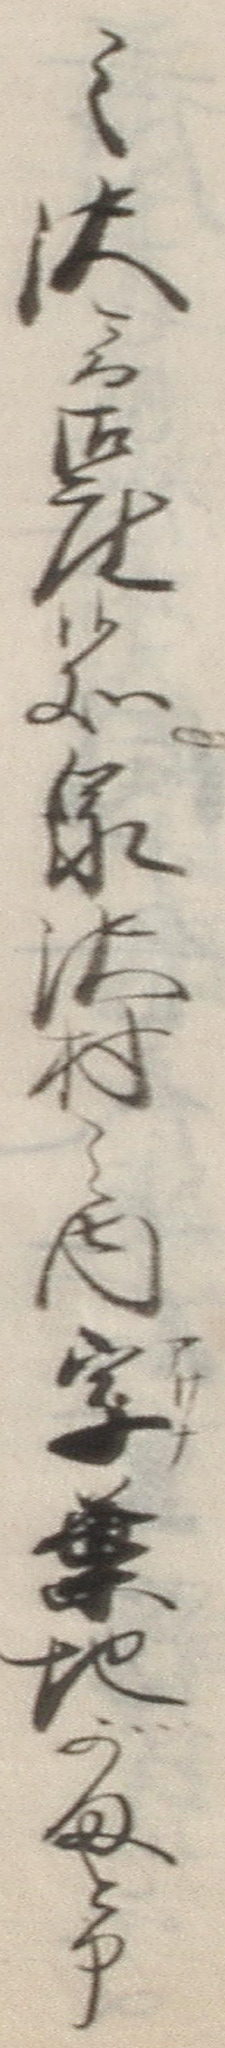之沢ニ而御座候処泉沢村之内字桑地が母と申
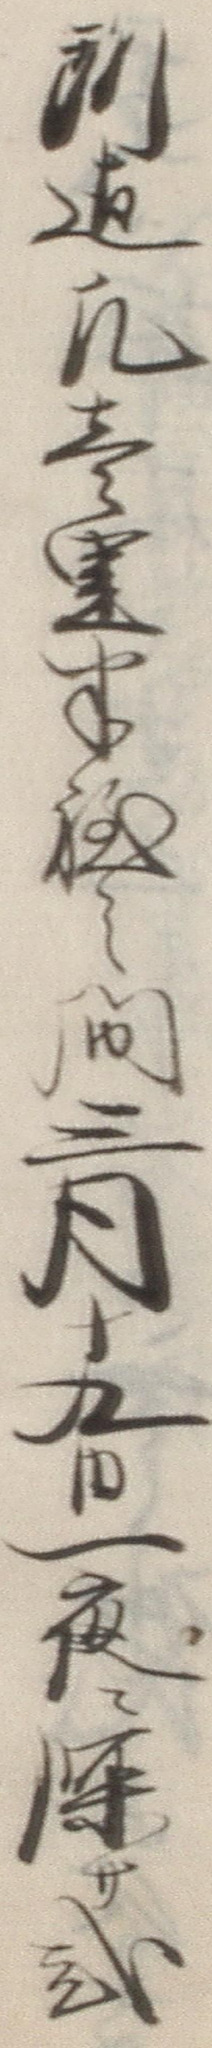所迄凡壱里半程之間三月十九日一夜ニ深サ弐
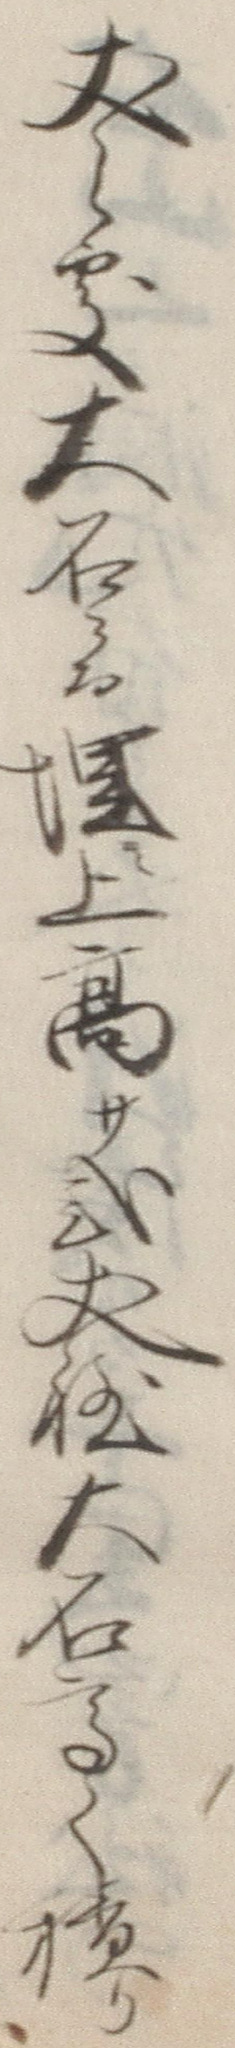丈之処大石ニ而埋上高サ弐丈程大石高〳〵積り
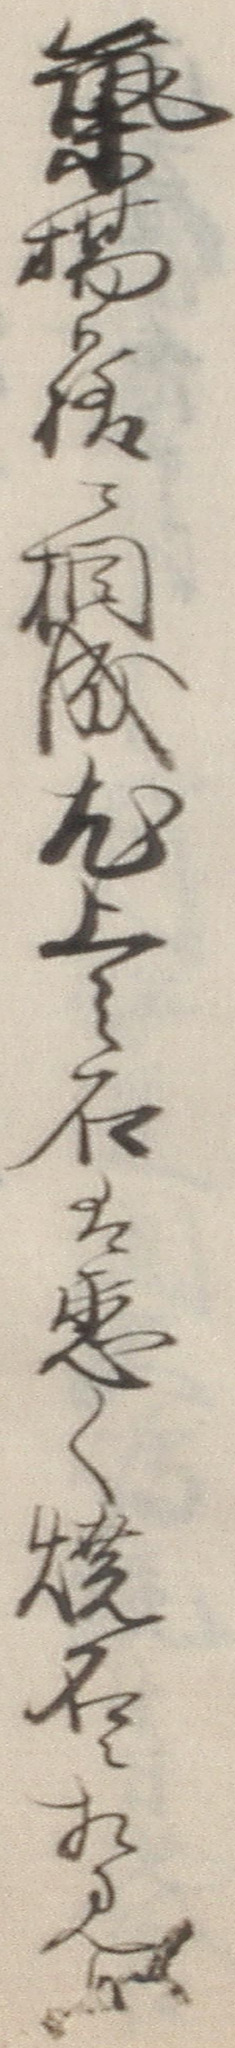築場候様ニ相成尤上之石は悉く焼石ニ相見候
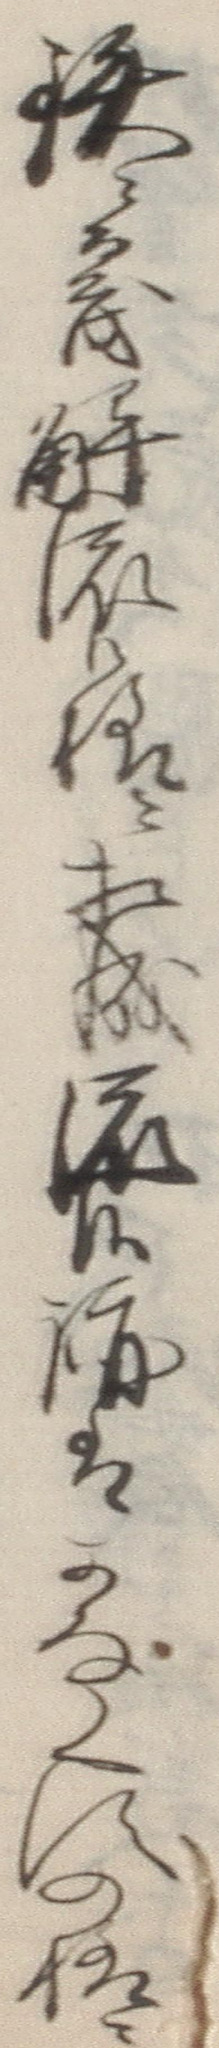鉄ニ而も解流候様ニ相成流候跡はかなくすの様ニ
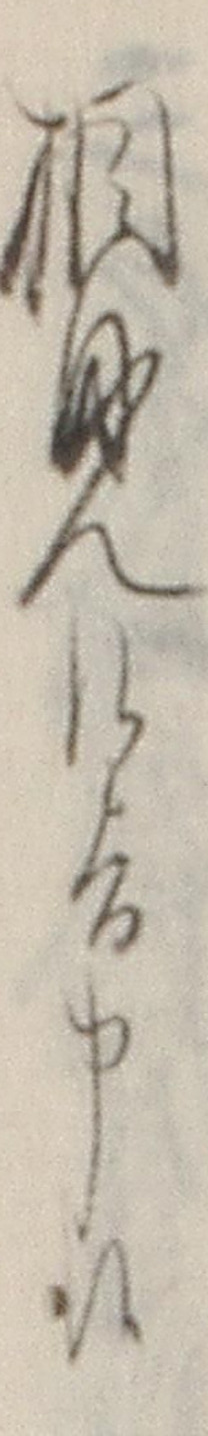相見候旨申候
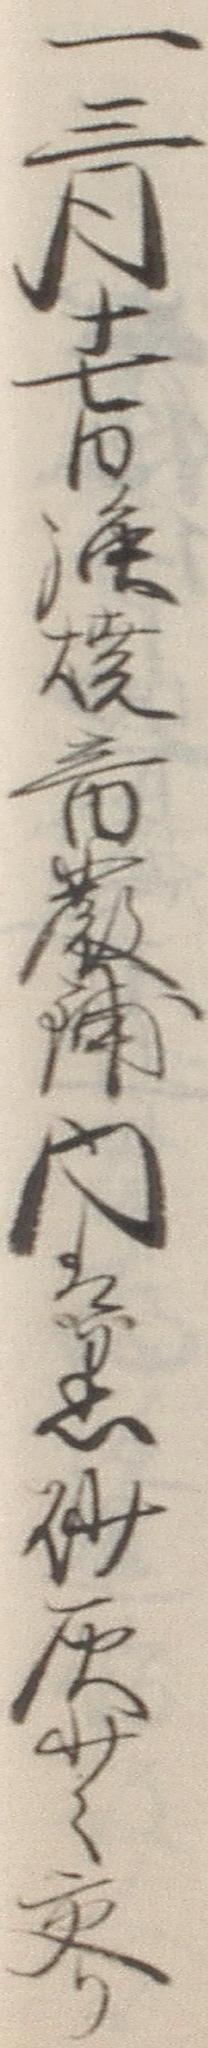一三月十七日強焼音厳鋪内は黒砂灰少々交り
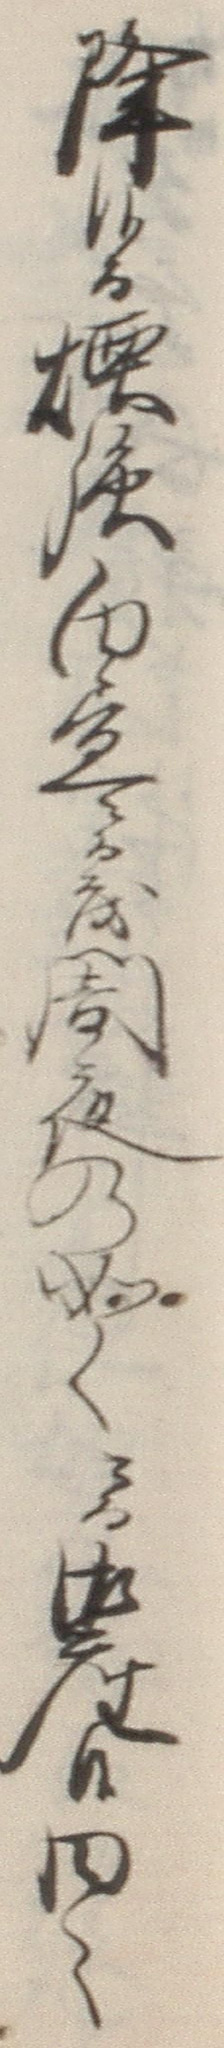降候而煙強白昼ニ而も闇夜の如くニ而御座候日々
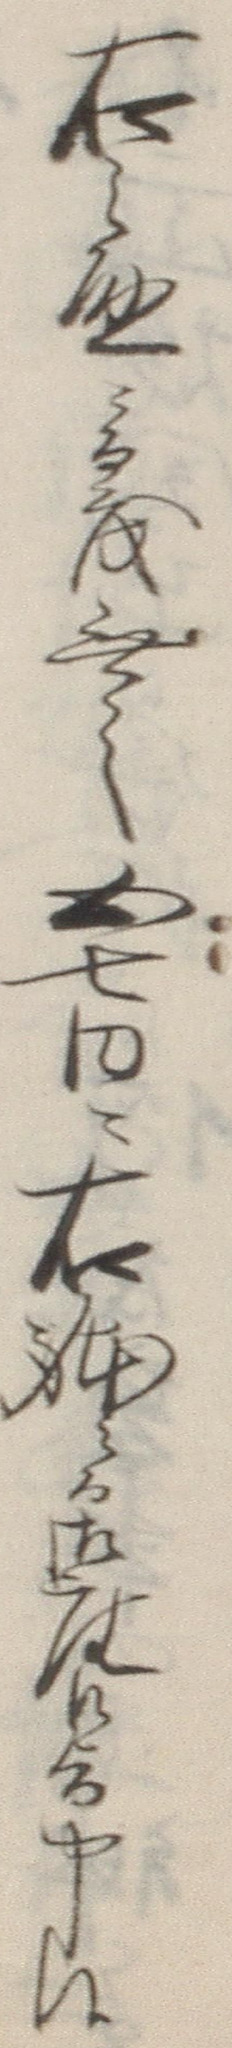右之通ニ而も無之五七日ニ右躰ニ而御座候旨申候
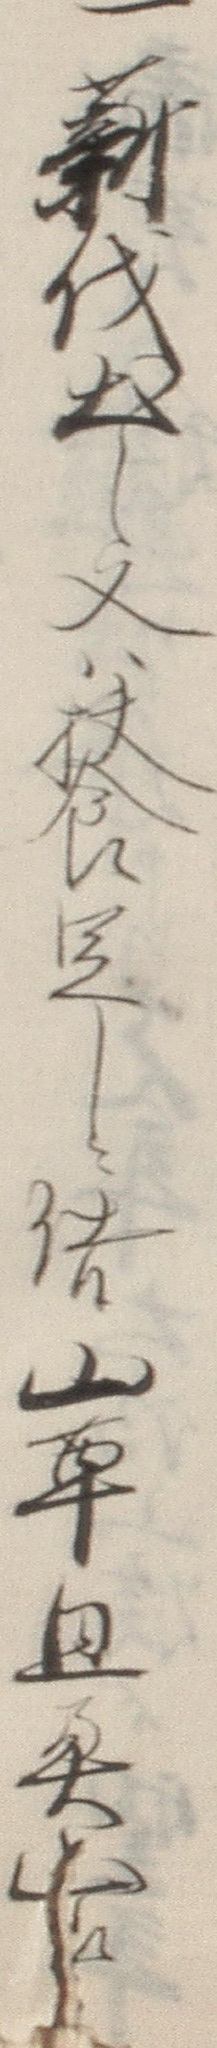一薪伐出し又ハ扶食足しニ仕候山草且奥山え
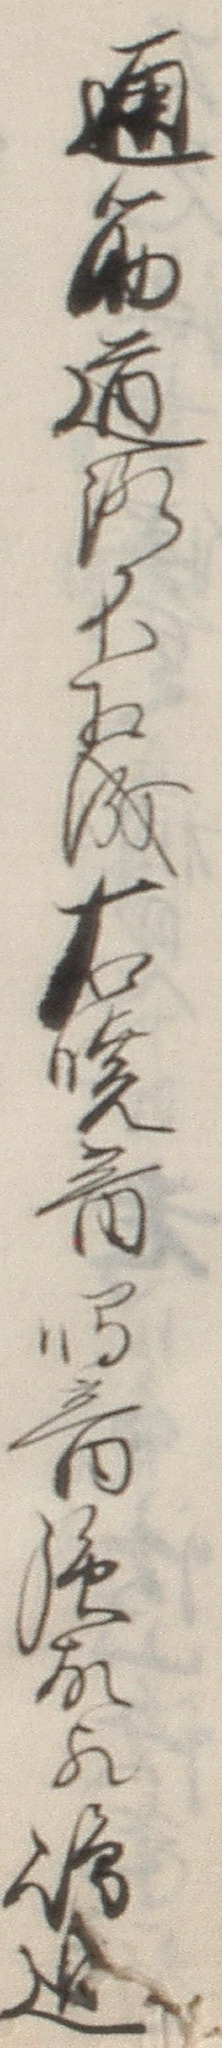通筋道路不相成右焼音鳴音強故歟嶋近
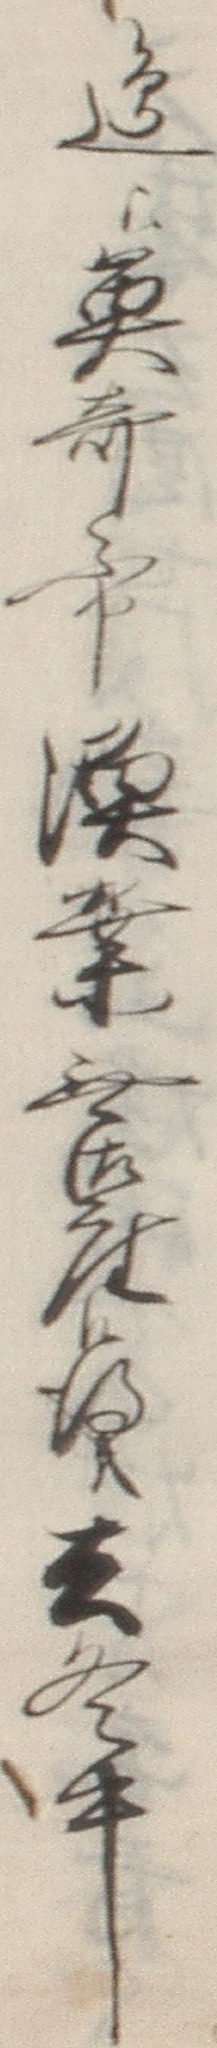辺え魚寄不申漁業無御座候得共去冬中
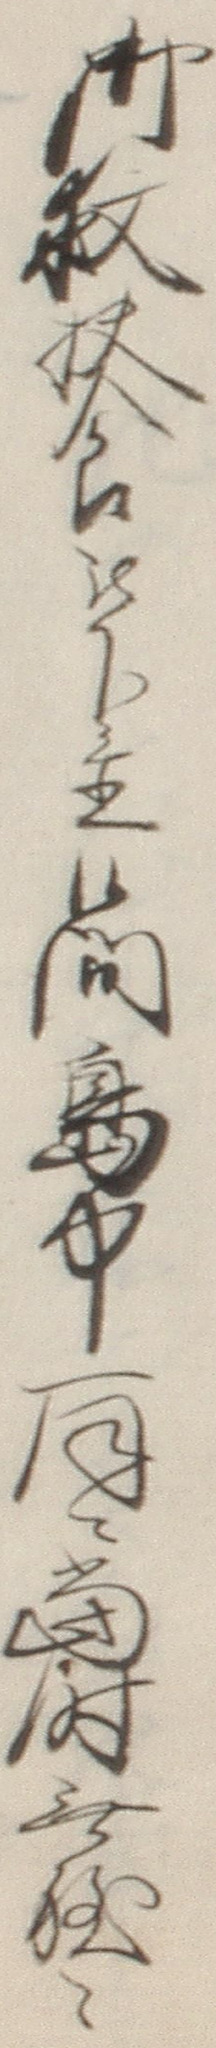御救扶食被下置候間島中一同ニ当時無難二
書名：[諸国災害記録]
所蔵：東京大学地震研究所図書室 Earthquake Research Institute Library, The University of Tokyo, JAPAN
